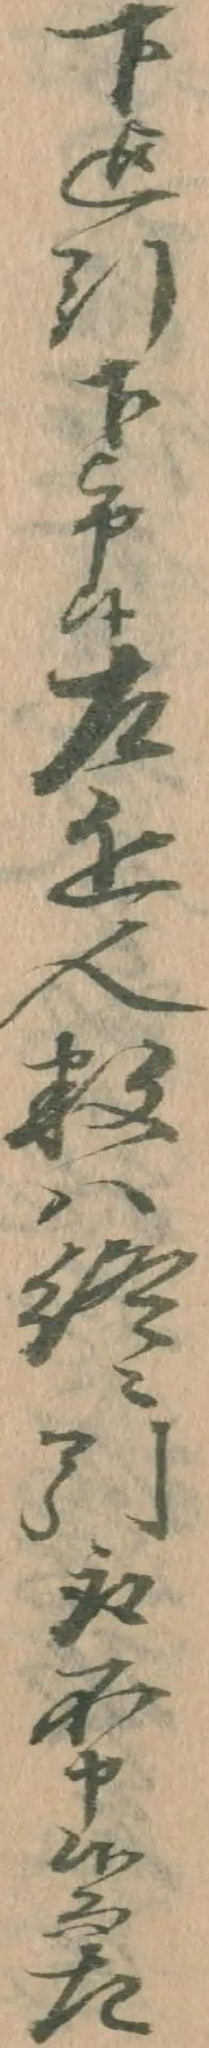下迄引下被申候左近人数は終に引取不申候而左
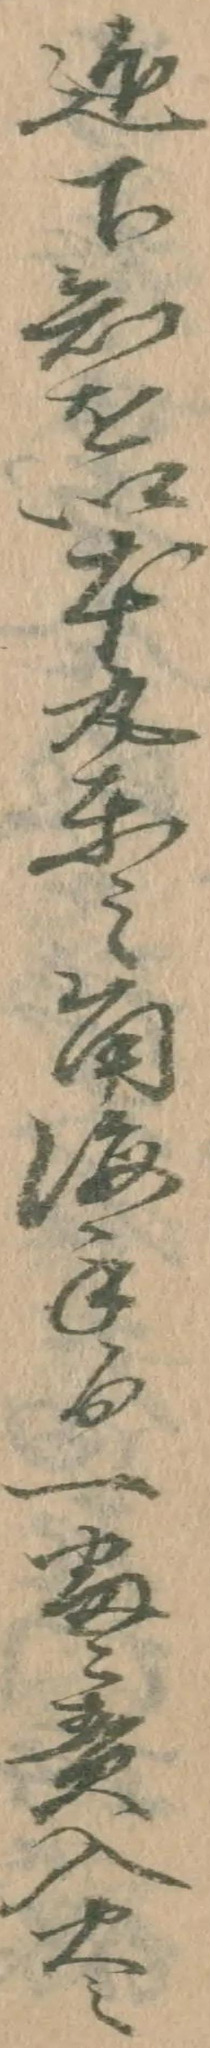近下知を以本丸東之角海手ゟ一番に責入火之
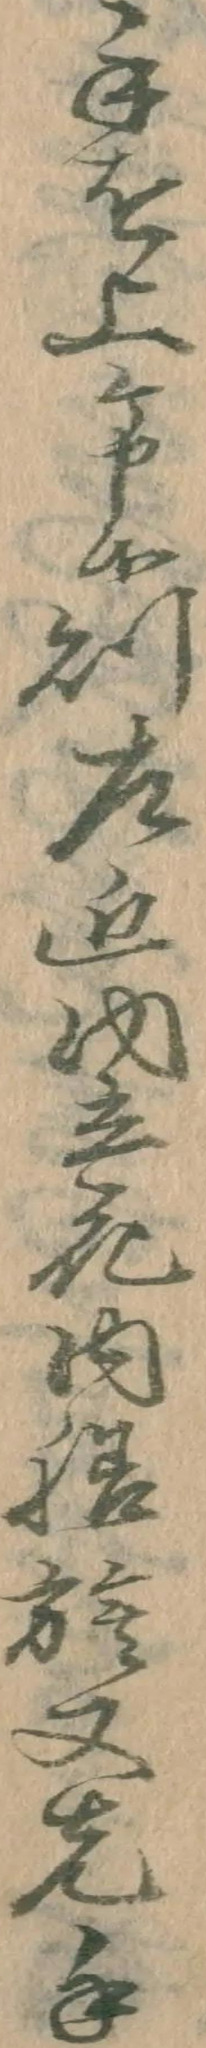手を上け申候則左近内立花内膳旗又先手
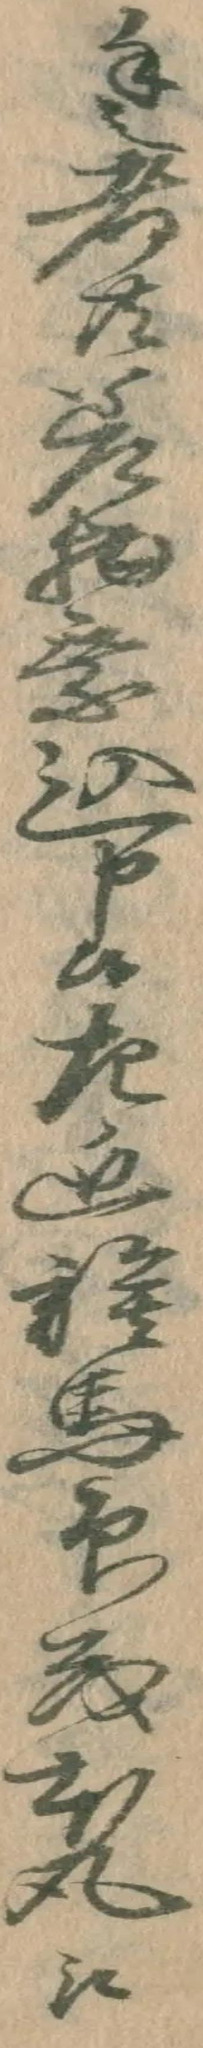手之者共差物乗込申候左近旗馬印茂本丸江
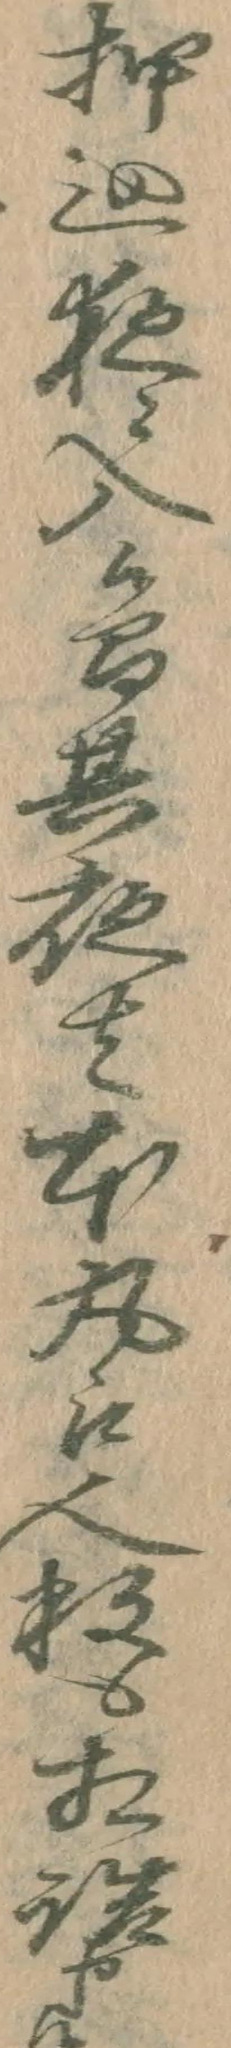押込夜に入候間其夜者本丸江人数も相詰申候
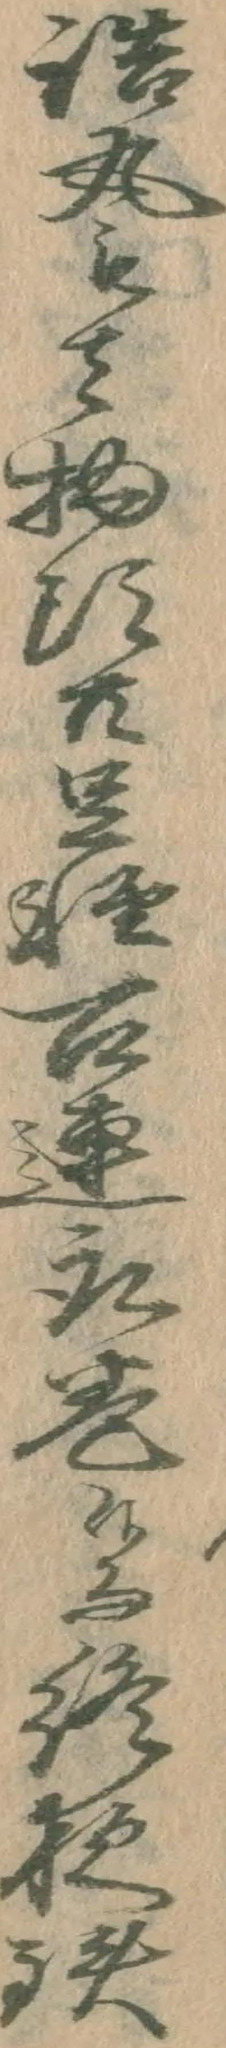詰丸江者物頭共足軽召連取巻候而終夜鉄
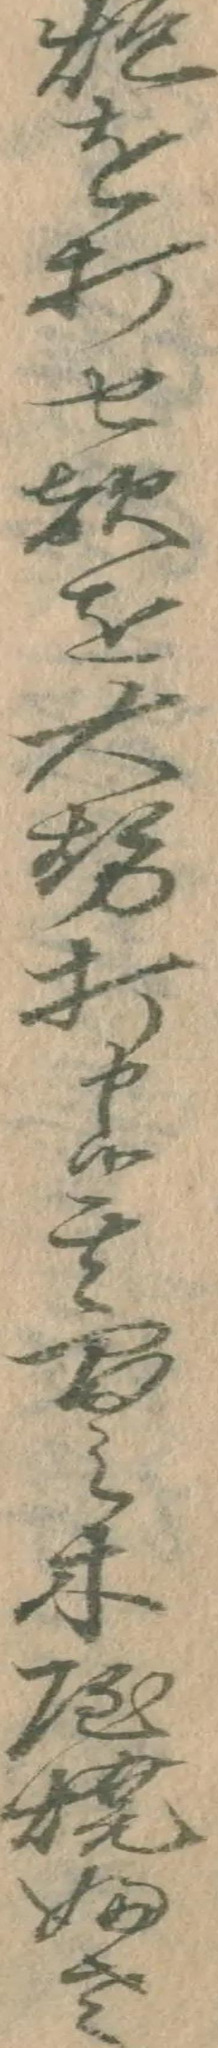炮を打せ敵を大勢打申候其間之木屋焼婦さ
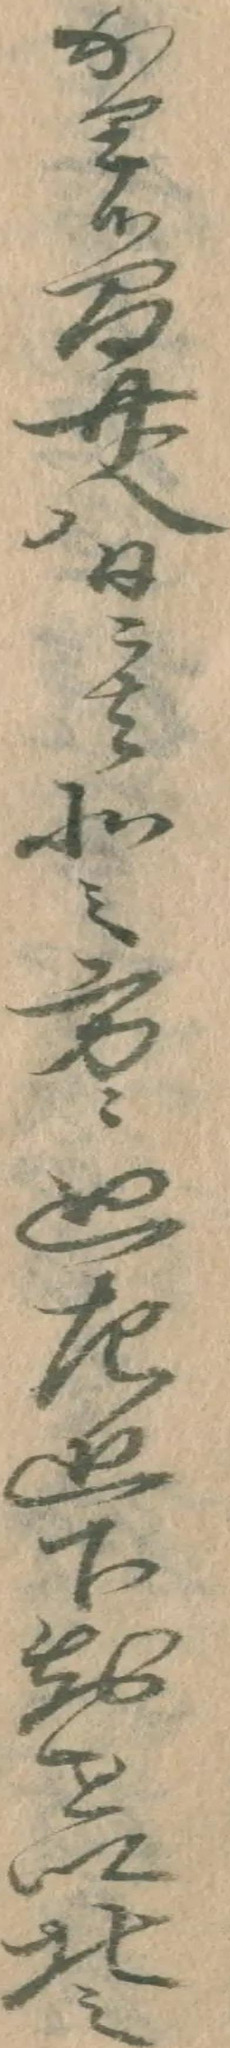か里候間廿八日に者北之方に廻左近下知を以北之
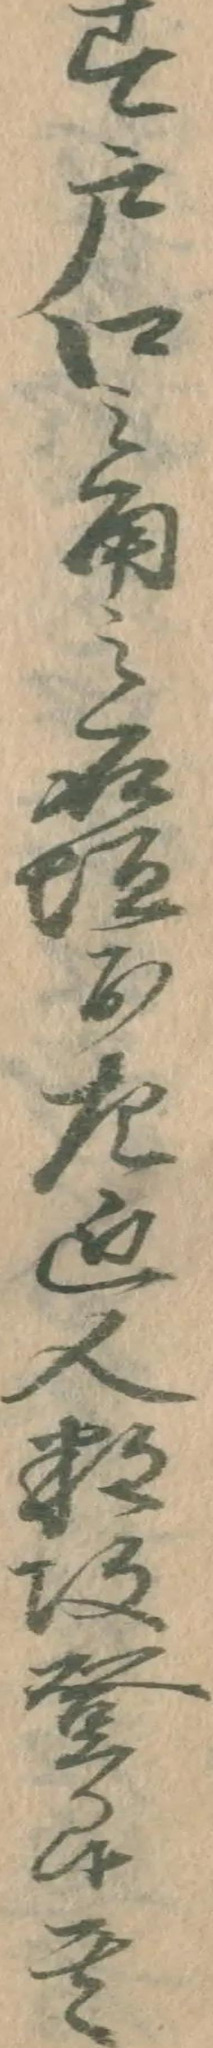春戸口之角之石垣ゟ左近人数攻登り候其
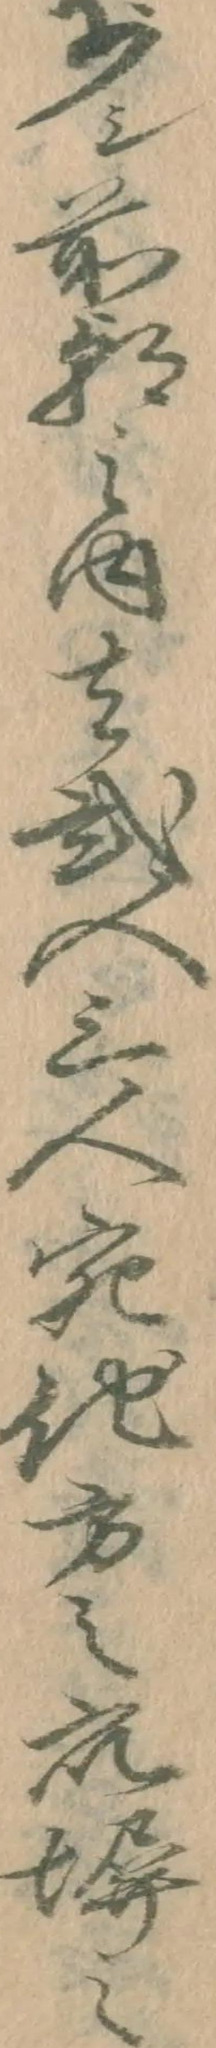少し前朝之内者弐人三人宛他方之衆塀之

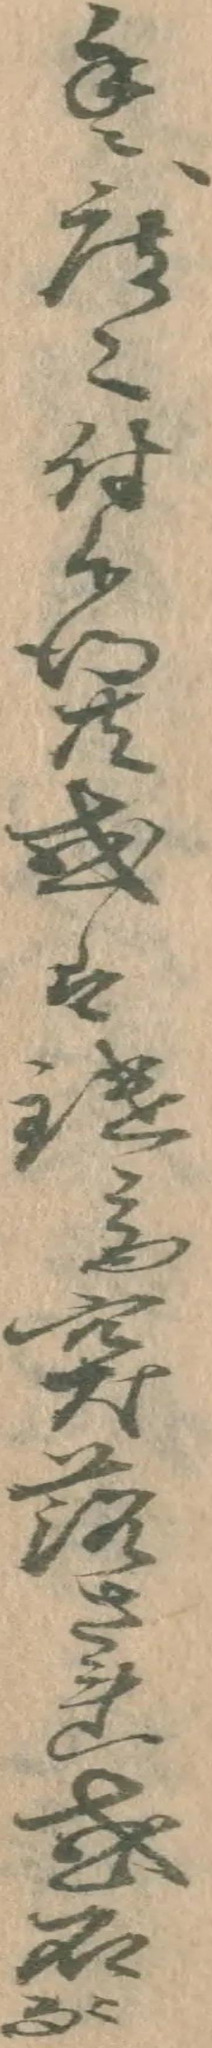手に度々付候得共或盤鑓に而突落さ連或石に而
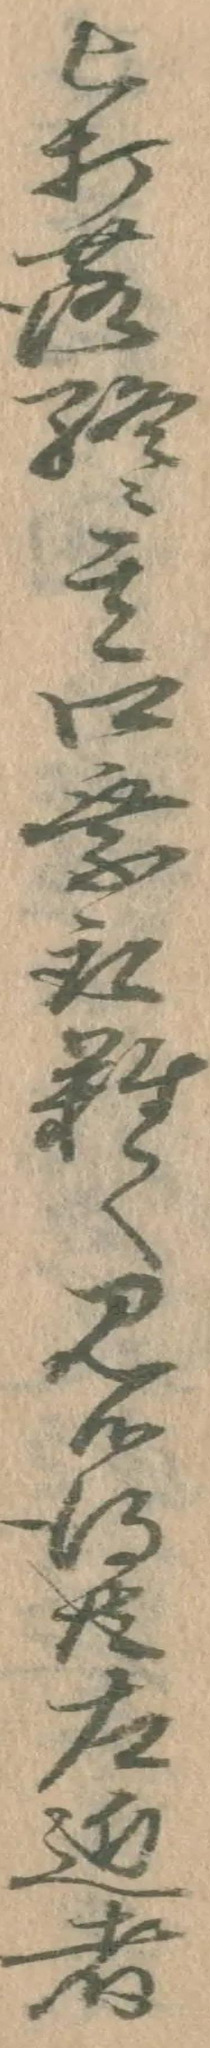被打落終に其口乗取難く見候得共左近者
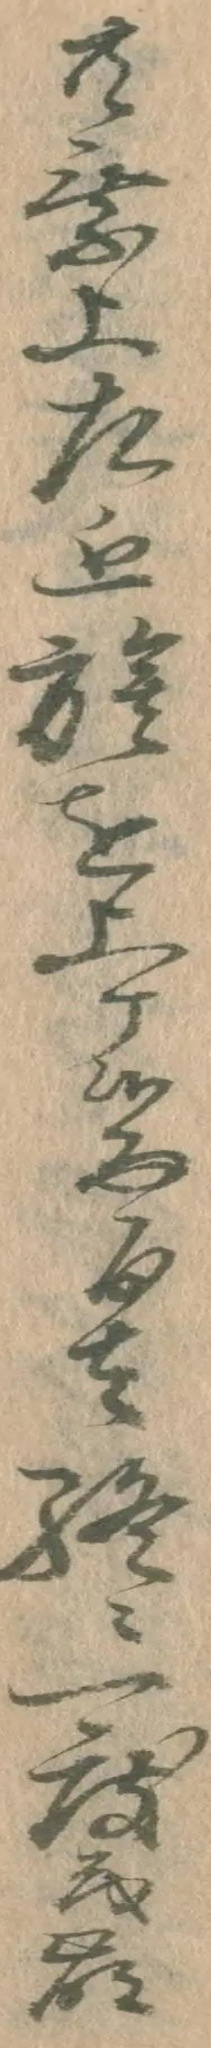共乗上左近旗を上け候而ゟ者終に一度茂崩
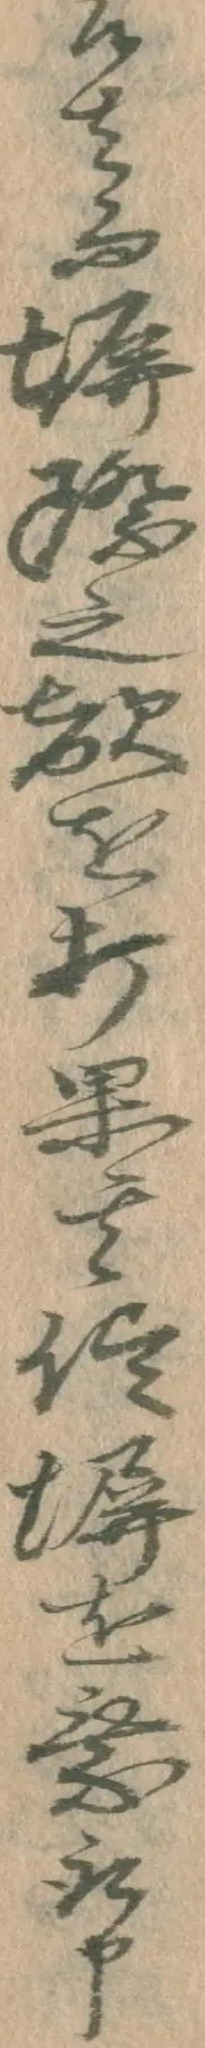候者而塀際之敵を打果其侭塀を乗取申
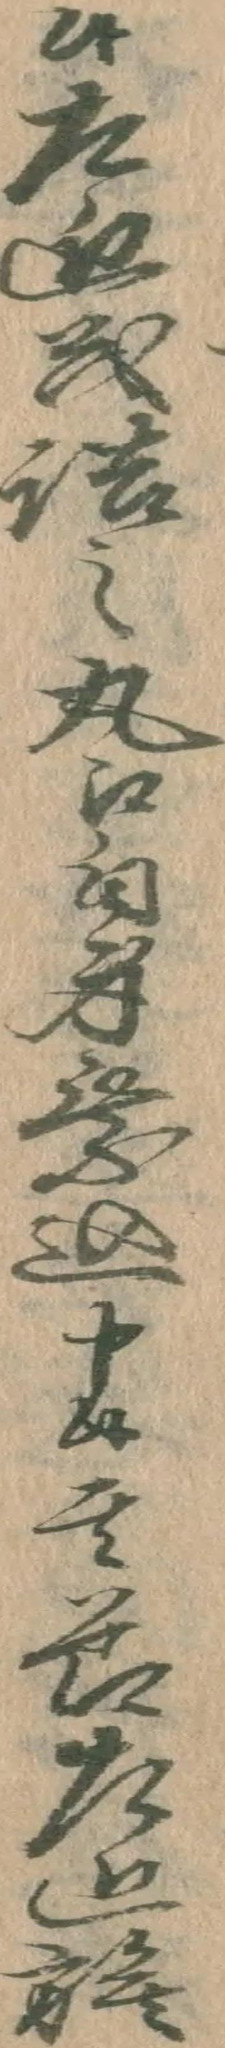候左近茂詰之丸江自身乗込申候其節左近旗
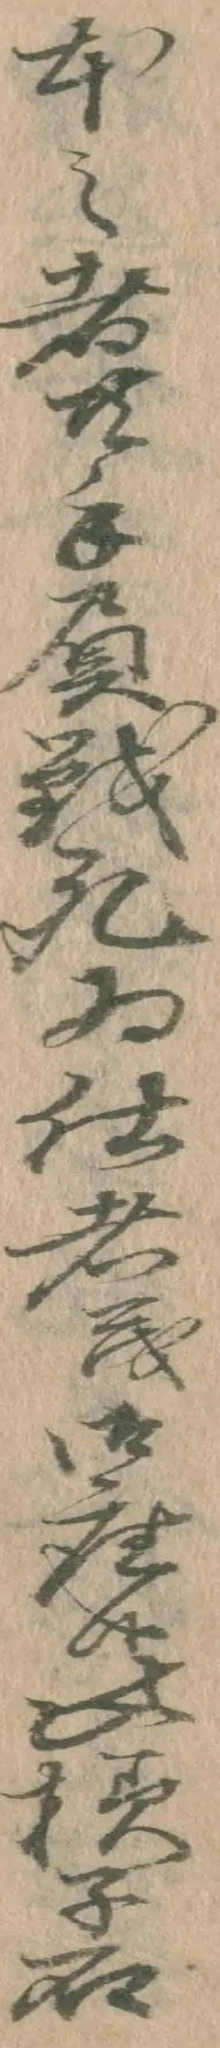本之者共手負戦死ゐ仕者茂御座候此様子石
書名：切支丹御退治記 49巻. [8]
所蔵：国立国会図書館 National Diet Library, JAPAN
